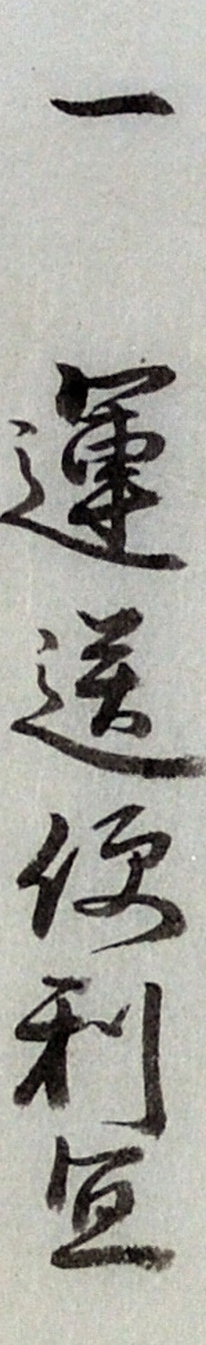一運送便利宜
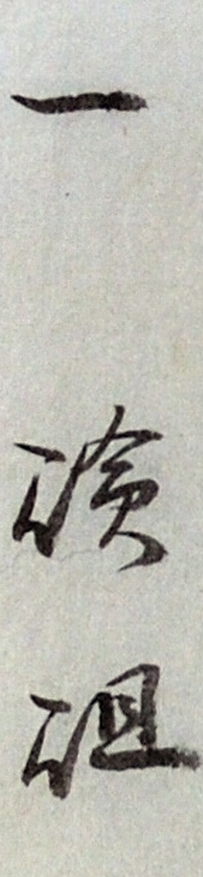一嶮岨

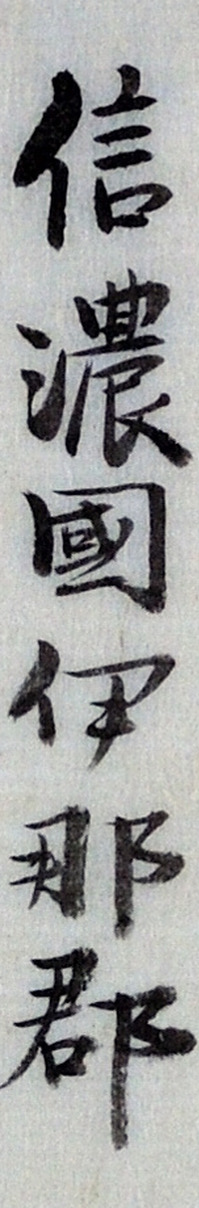信濃国伊那郡
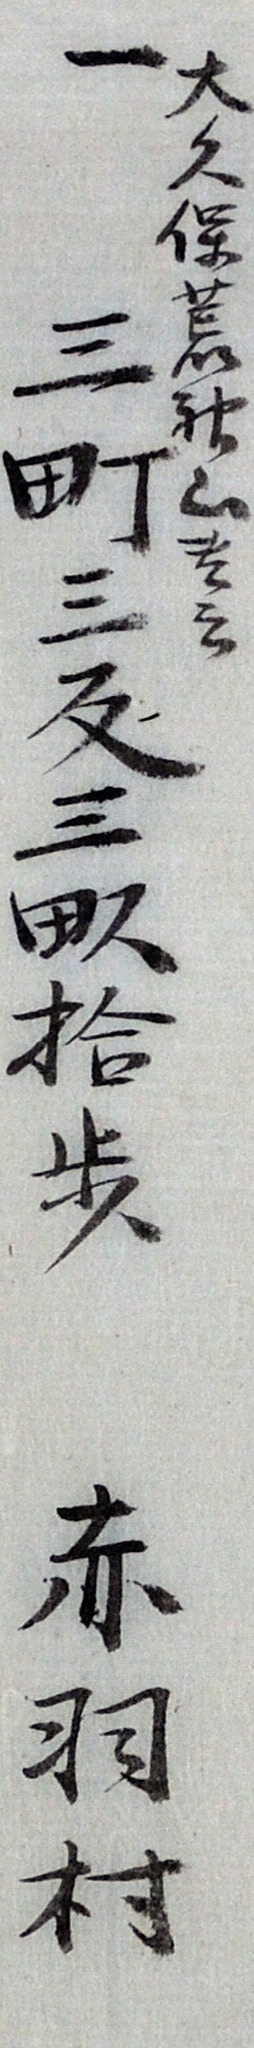一三町三反三㽗拾歩赤羽村
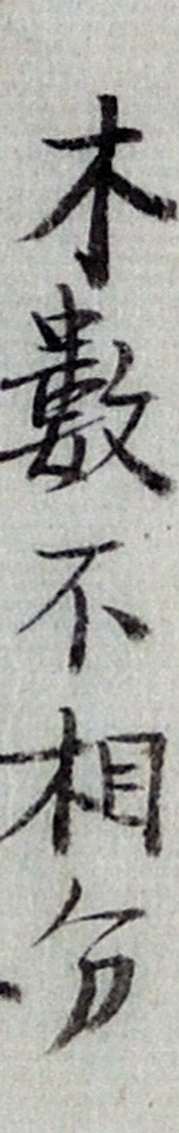木数不相分
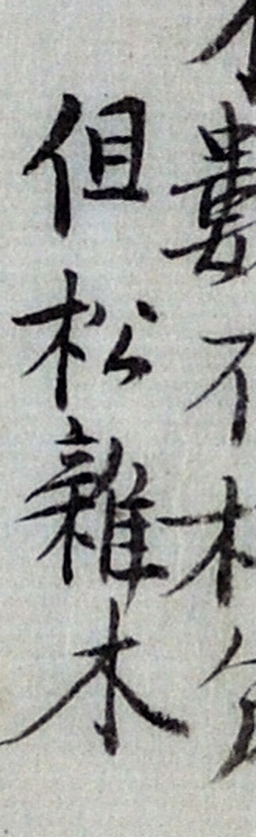但松雑木
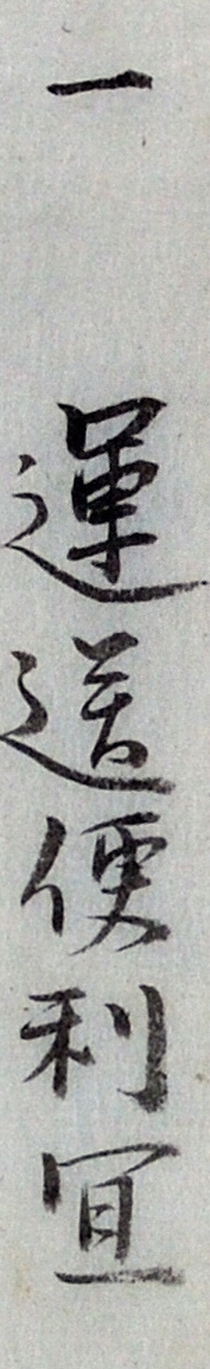一運送便利宜
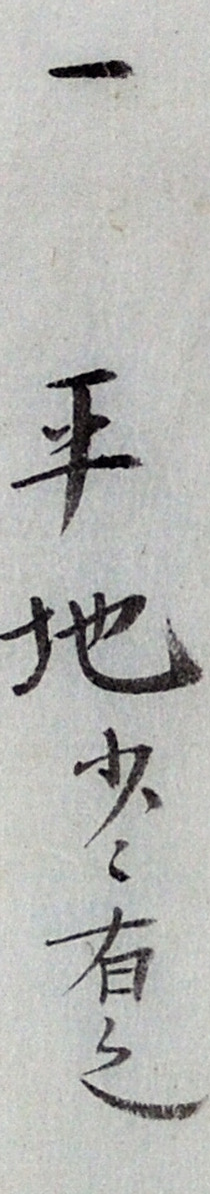一平地少々有之

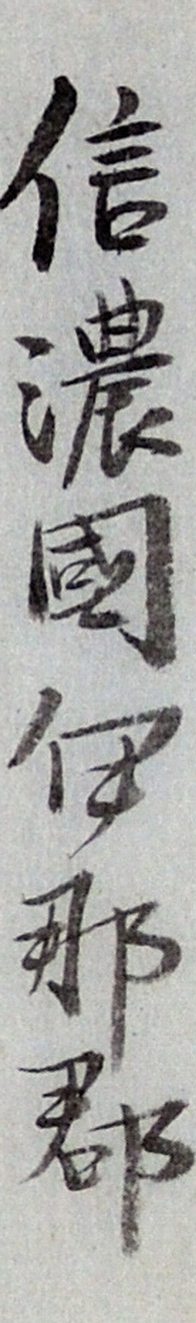信濃国伊那郡
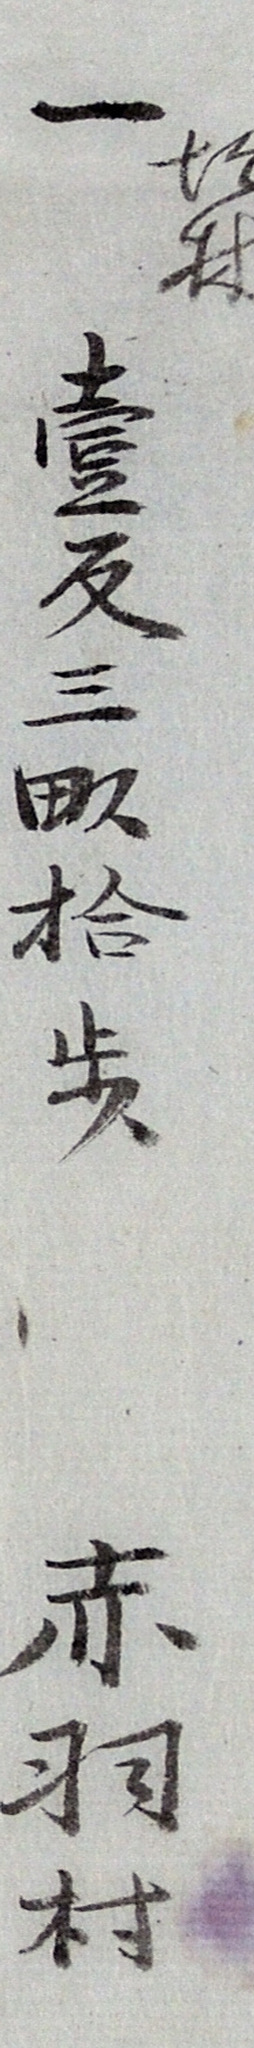一壱反三㽗拾赤羽村
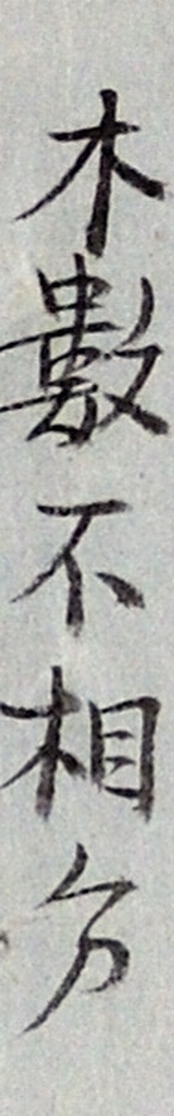木数不相分
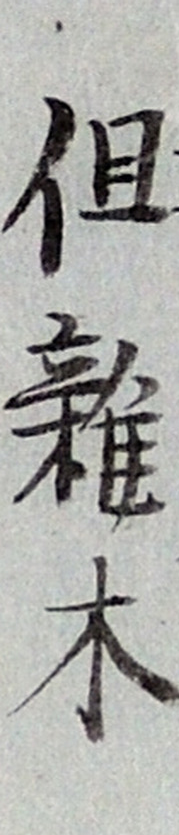但雑木
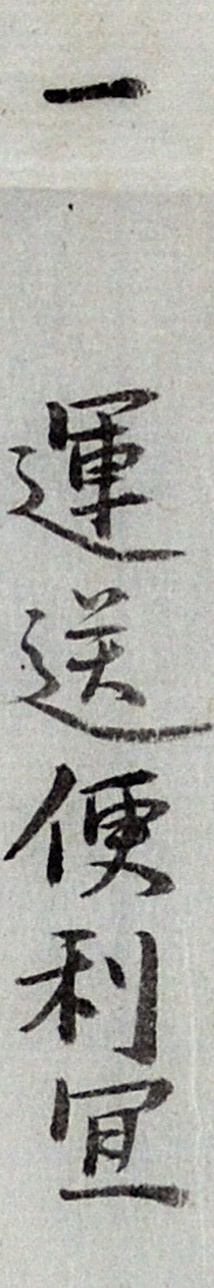一運送便利宜
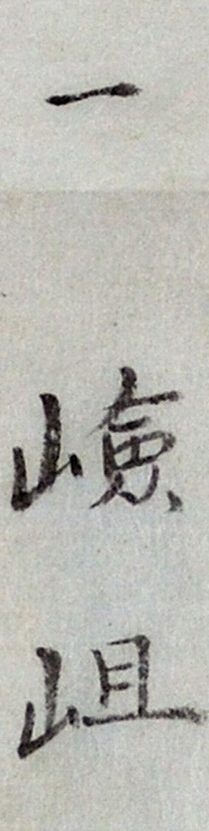一嶮岨
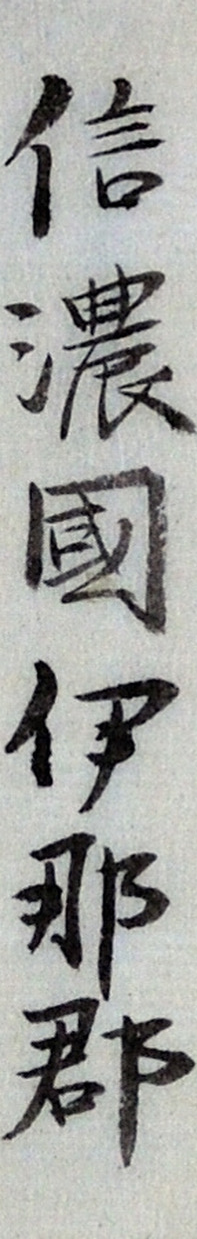信濃国伊那郡
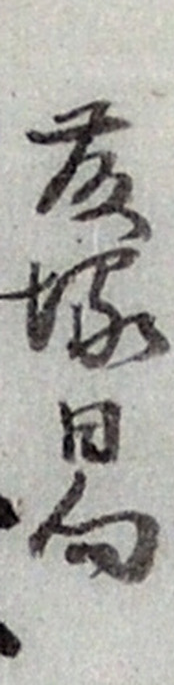藤塚日向
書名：官林反別帳
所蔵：伊那市立高遠町図書館・合同会社AMANE
